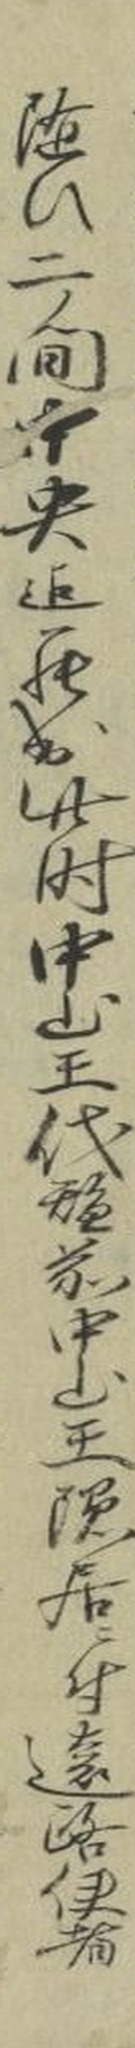随ひ二の間中央迄罷出此時中山王代代替前中山王隠居に付遠路使者
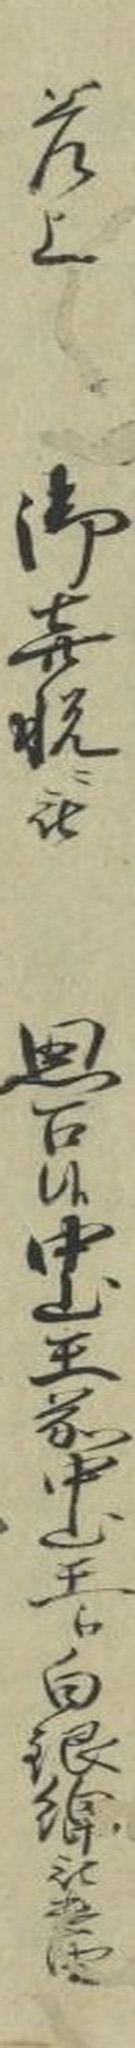差上御喜悦に被思召候中山王前中山王え白銀綿被遣由
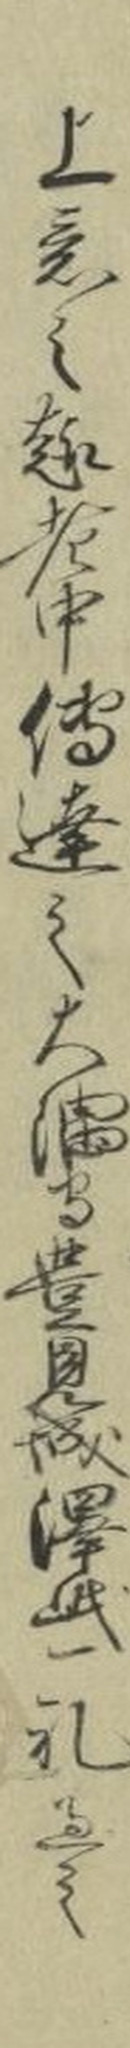上意之趣老中伝達之大隅守豊見城沢岻一礼過之
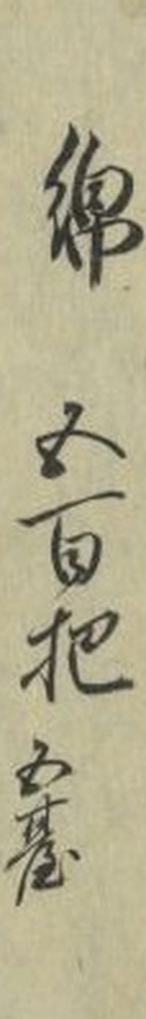綿五百把五台
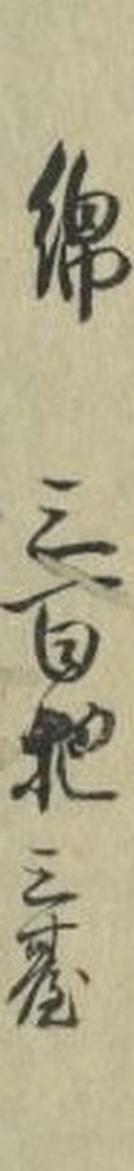棉三百把三台
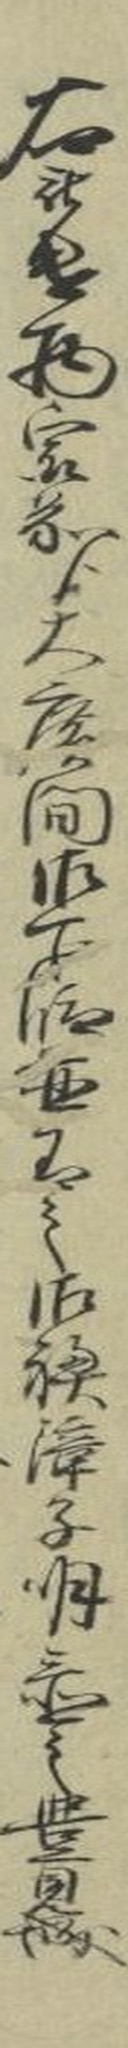一右被遣物最前ゟ大広間御下段並有之御襖障子明置之豊見城
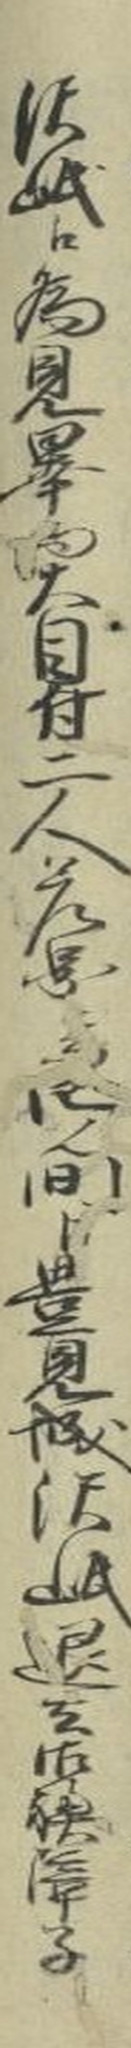沢岻え為見畢て大目付二人差図にて四の間え豊見城沢岻退出御襖障子
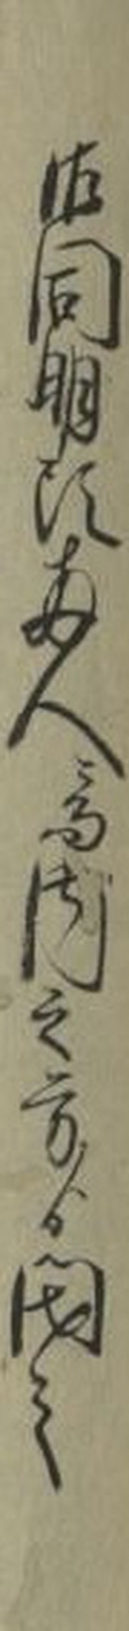御同朋頭両人にて内之方ゟ閉之
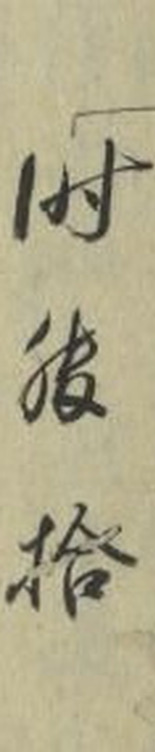時服拾
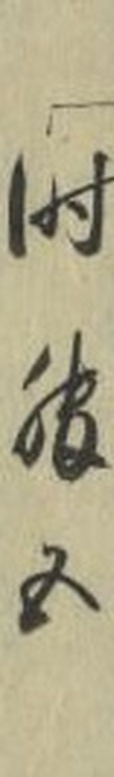時服五
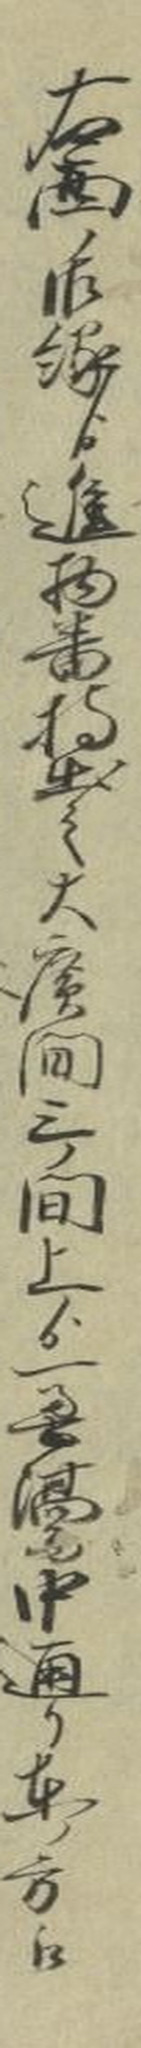右西の御縁ゟ進物番持出之大広間三の間上ゟ一畳隔て中通り東の方え
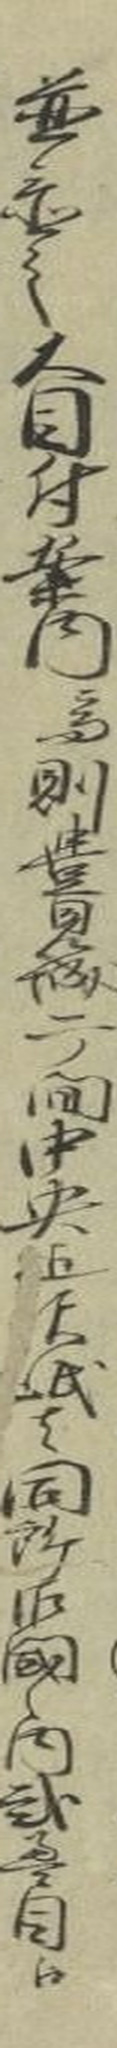並置之大目付案内にて則豊見城二の間中央迄沢岻は同所御閾之内弐畳目え
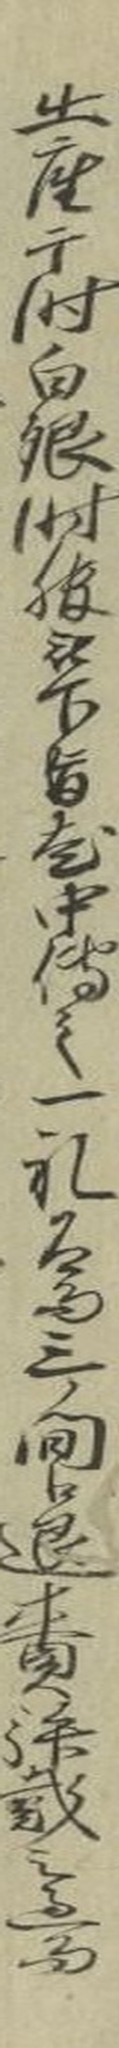出座于時白銀時服被下旨老中伝之一礼有て三の間え退賚拝戴之過て
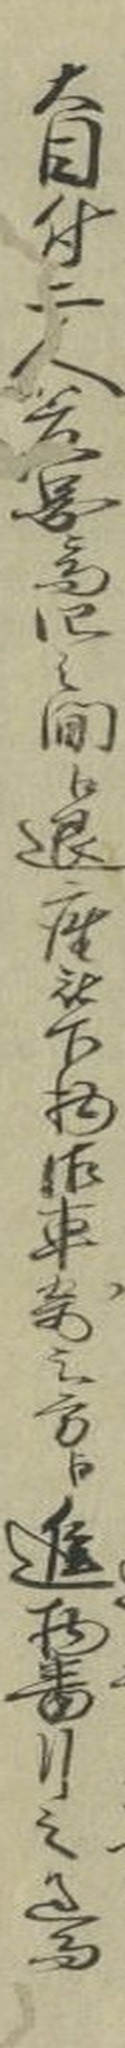大目付二人差図にて四之間え退座被下物御車寄之方え進物番引之過て
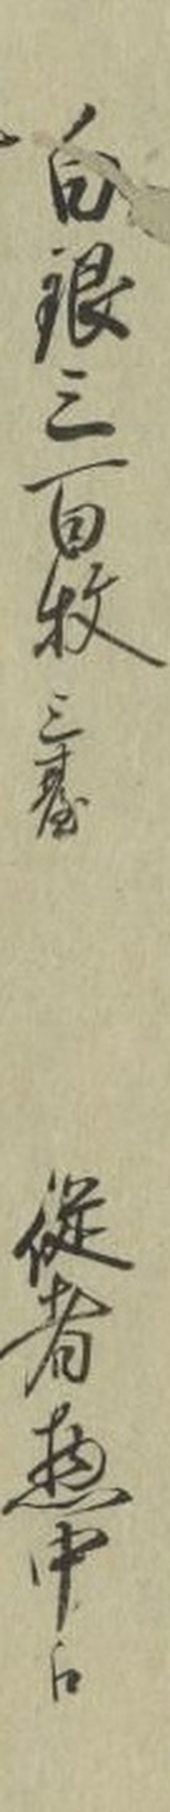白銀三百枚三台従者惣中え
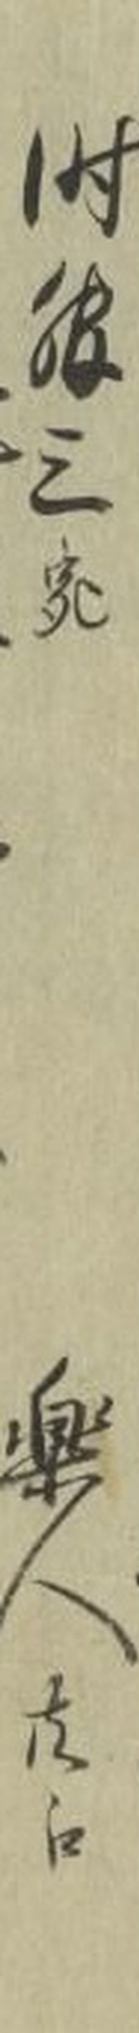時服三宛楽人共え
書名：天保三壬辰年琉球人参府之節勤方書留
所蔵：University of the Ryukyus Library
